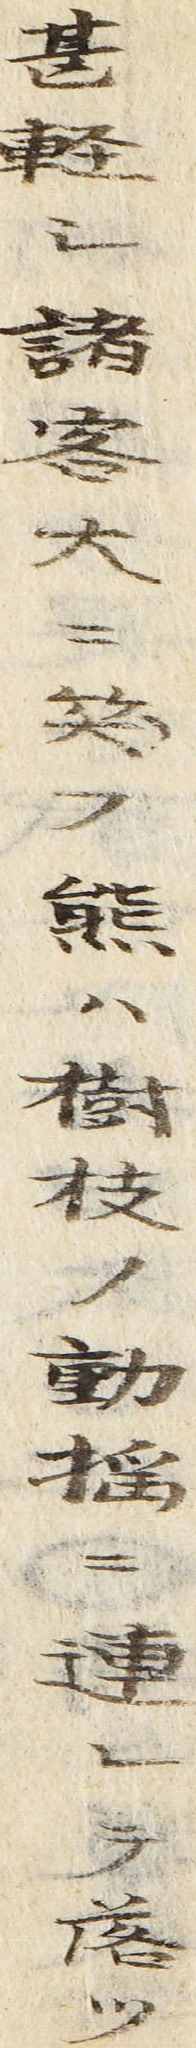甚軽シ諸客大ニ笑フ熊ハ樹枝ノ動揺ニ連レテ落ツ
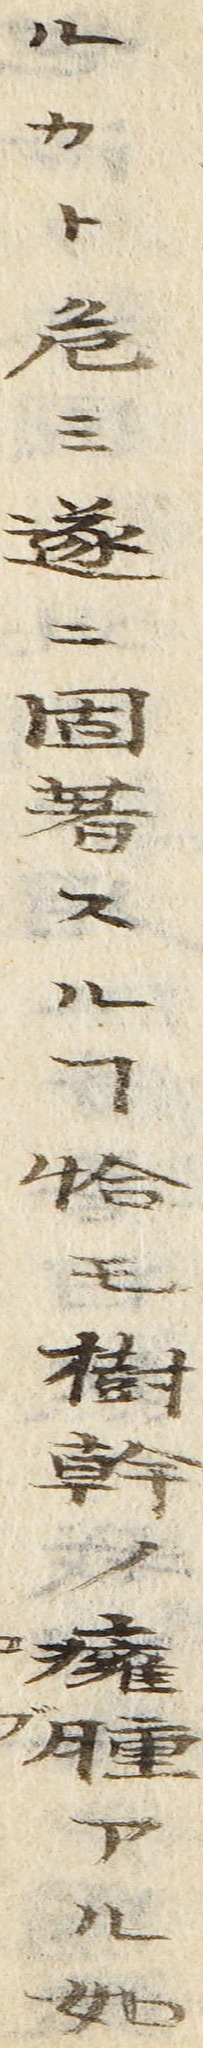ルカト危ミ遂ニ固著スルコト恰モ樹幹ノ癕腫アル如
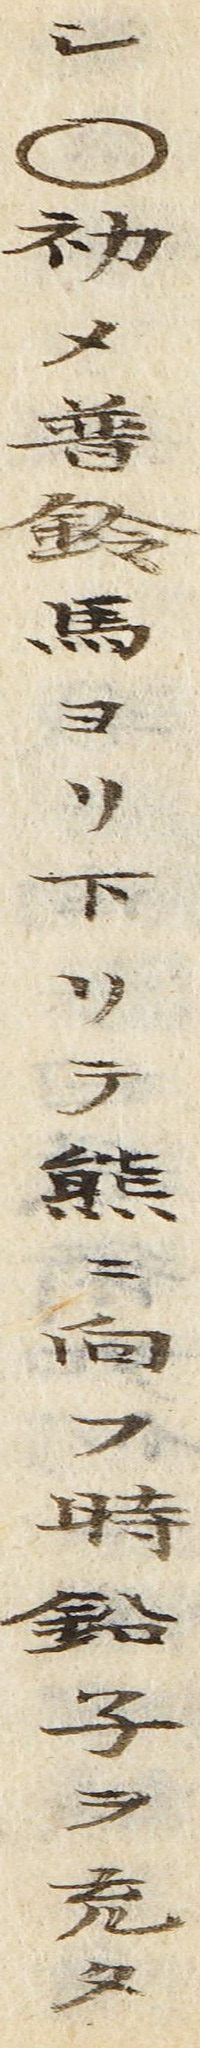シ◯初メ普鈴馬ヨリ下リテ熊ニ向フ時鉛子ヲ充タ
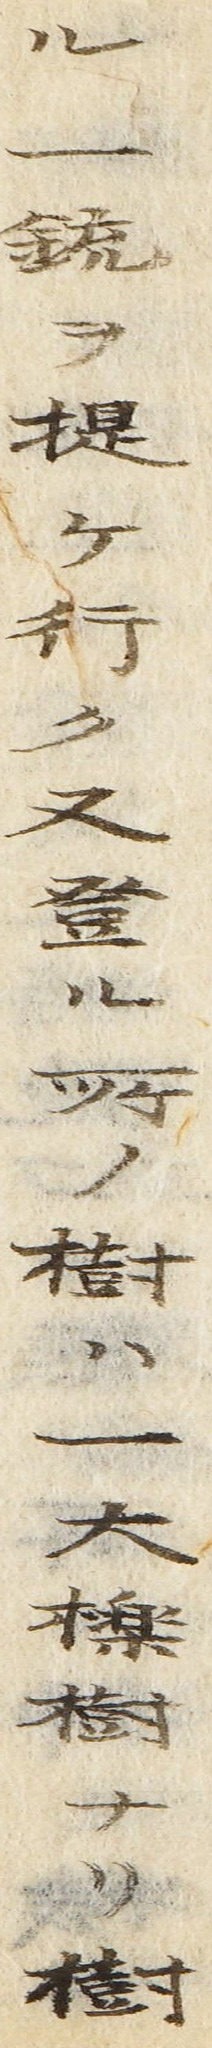ル一銃ヲ提ケ行ク又登ル所ノ樹ハ一大櫟樹ナリ樹
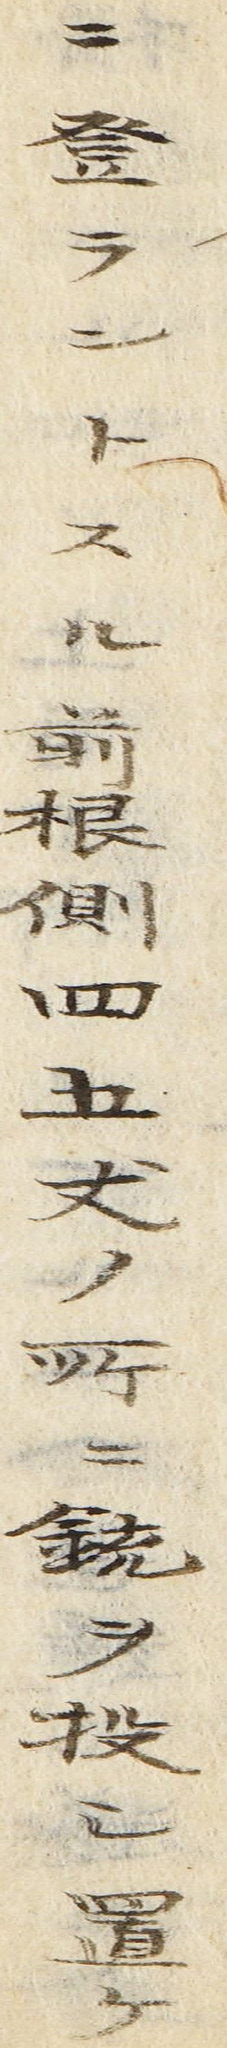ニ登ラントスル前根側四五丈ノ所ニ銃ヲ投シ置ケ
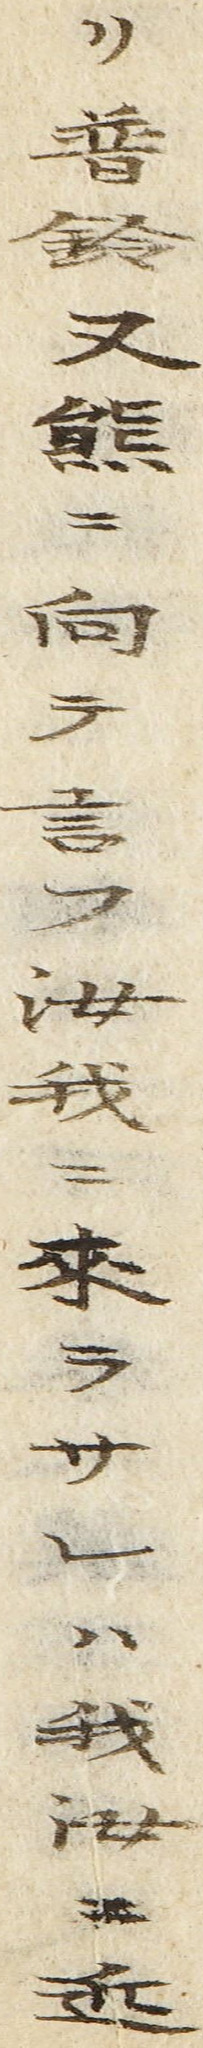リ普鈴又熊ニ向テ言フ汝我ニ来ラサレハ我汝ニ近
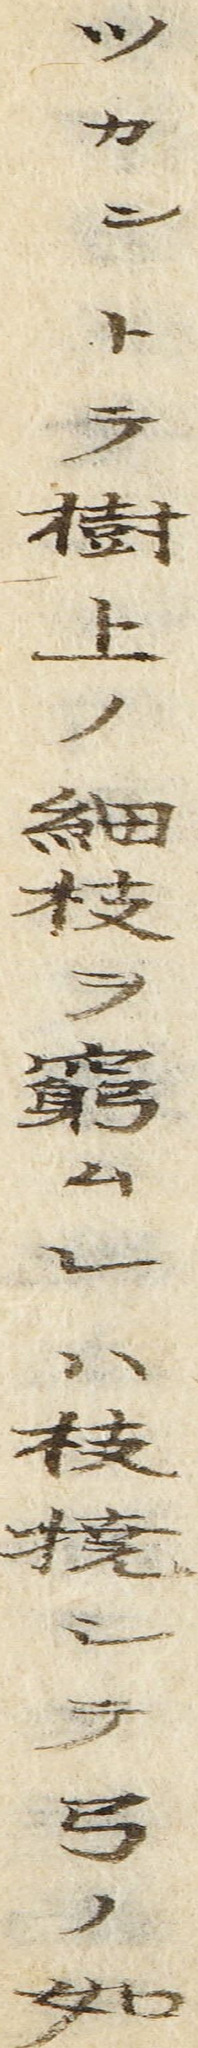ツカントテ樹上ノ細枝ヲ窮ムレハ枝撓シテ弓ノ如

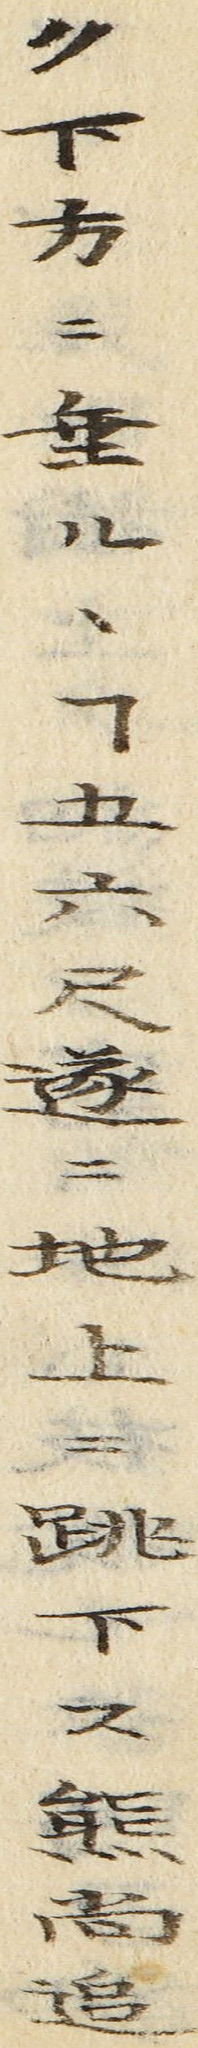ク下方ニ垂ルヽコト五六尺遂ニ地上ニ跳下ス熊尚追
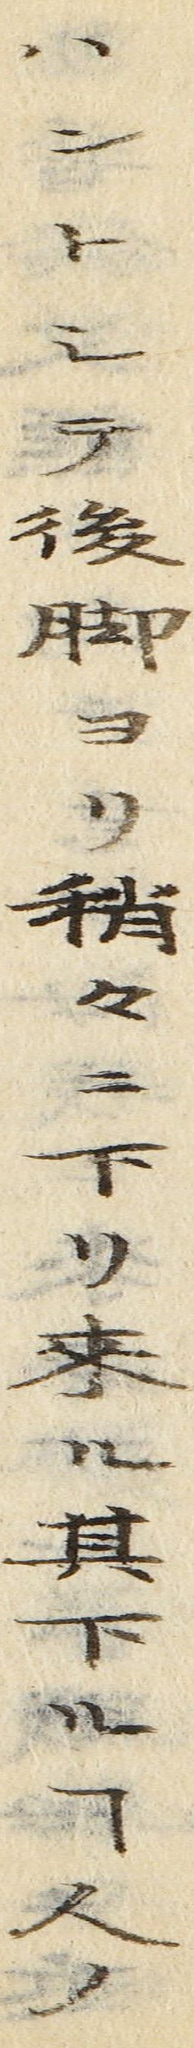ハントシテ後脚ヨリ稍々ニ下リ来ル其下ルコト人ノ
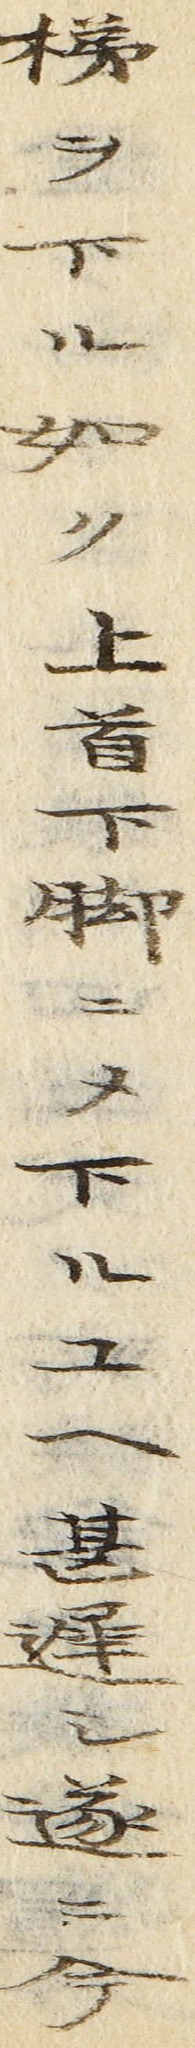梯ヲ下ル如ク上首下脚ニシテ下ルユヘ甚遅シ遂ニ今
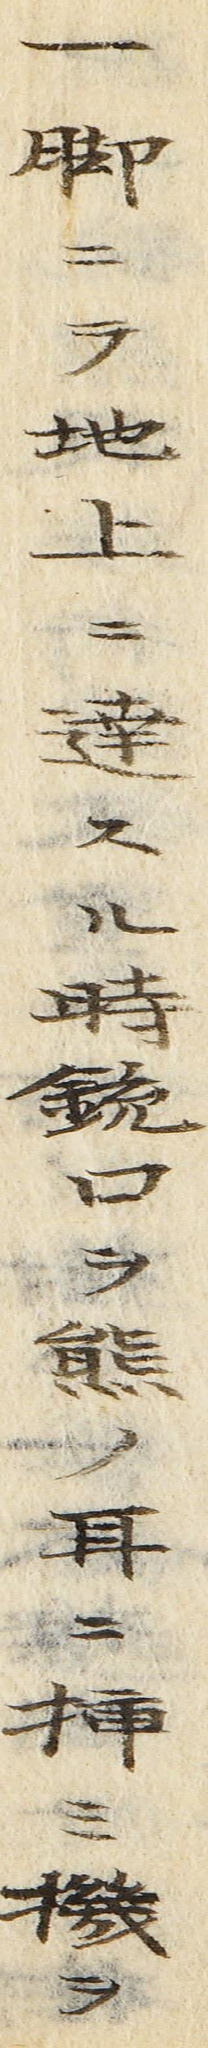一脚ニテ地上ニ達スル時銃口ヲ熊ノ耳ニ挿ミ機ヲ
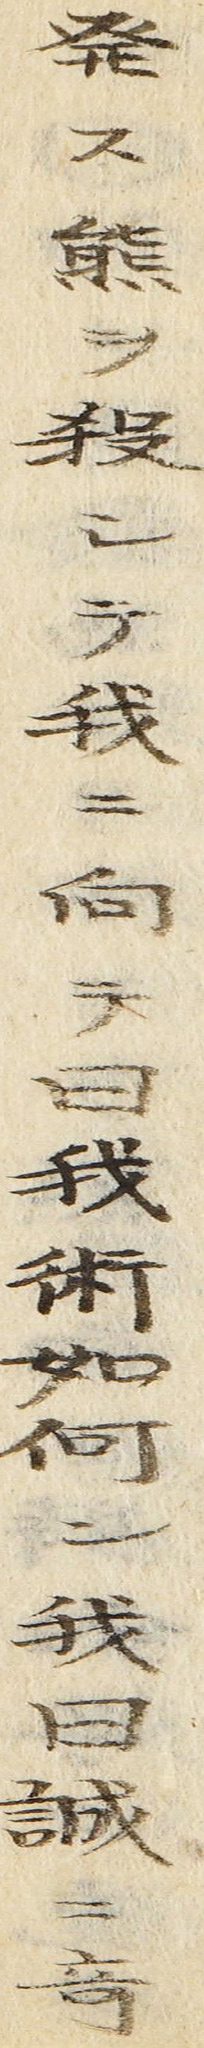発ス熊ヲ殺シテ我ニ向テ曰我術如何ン我曰誠ニ奇
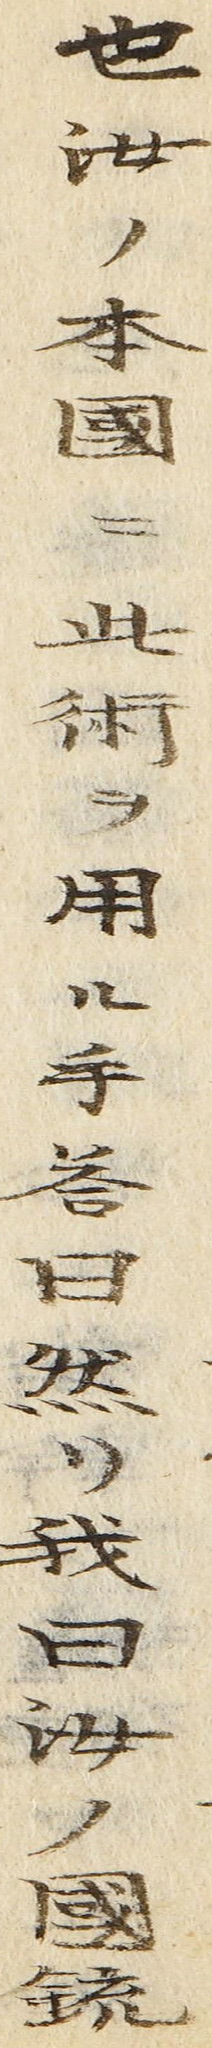也汝ノ本国ニ此術ヲ用ル乎答曰然リ我曰汝ノ国銃
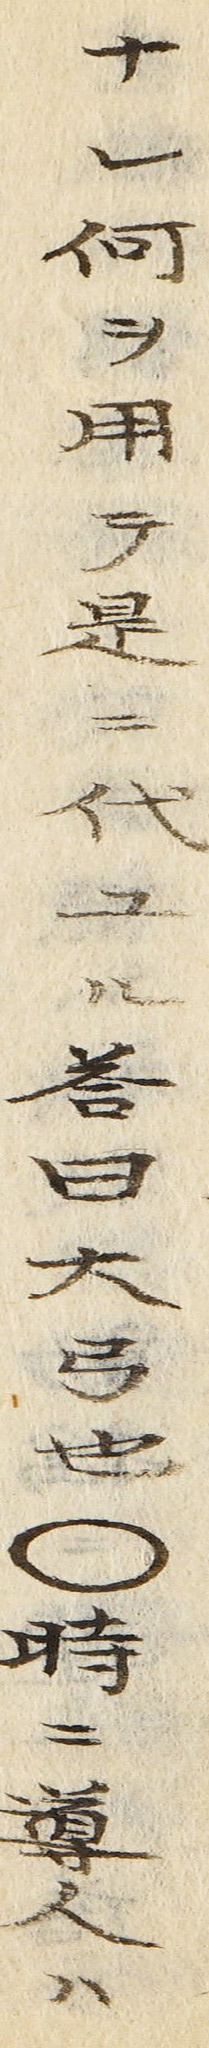ナレ何ヲ用テ是ニ代ユル答曰大弓也◯時ニ導人ハ
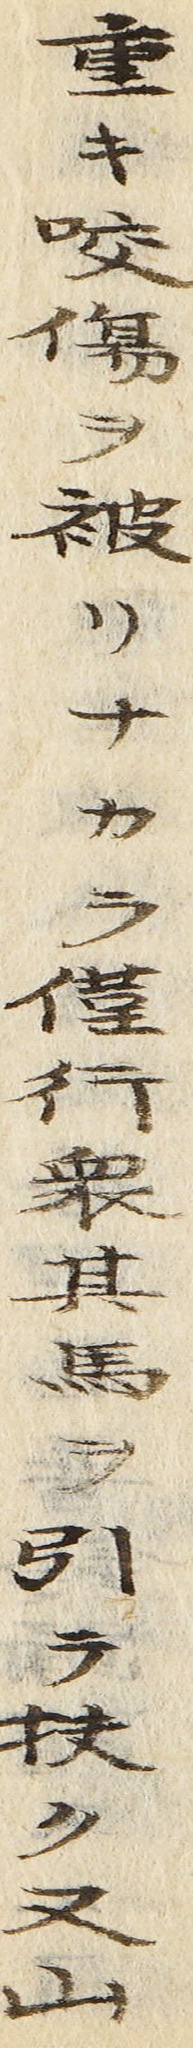重キ咬傷ヲ被リナカラ僅行衆其馬ヲ引テ扶ク又山
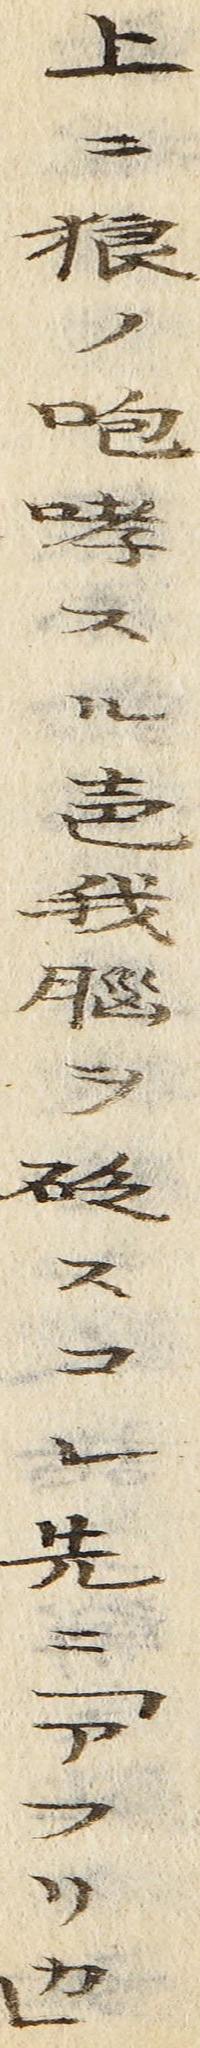上ニ狼ノ咆哮スル声我脳ヲ砭スコレ先ニ「アフリカ」
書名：漂流紀事
